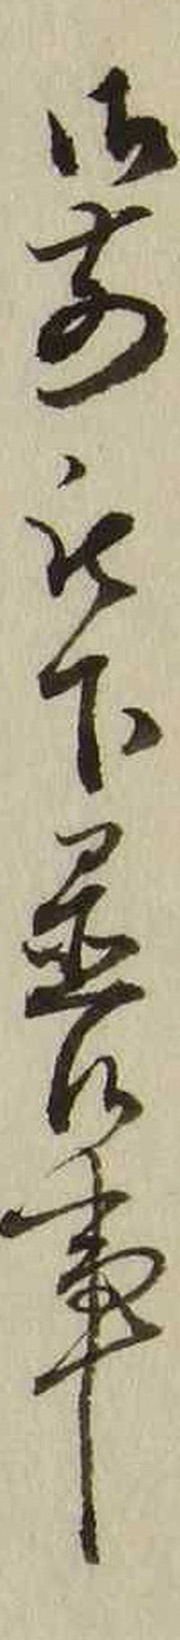御前被下置候事
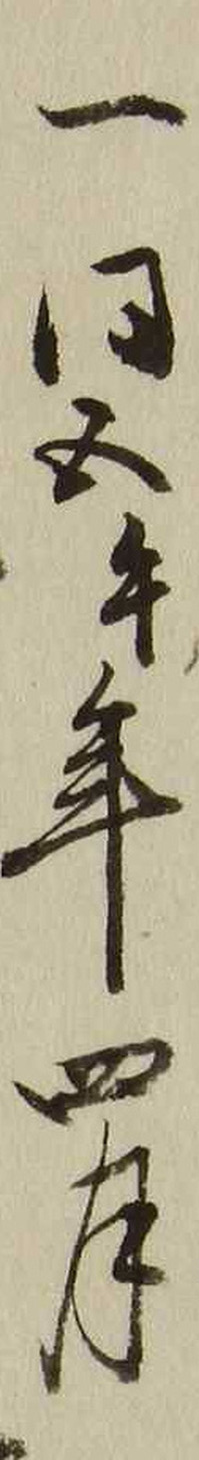一同五午年四月
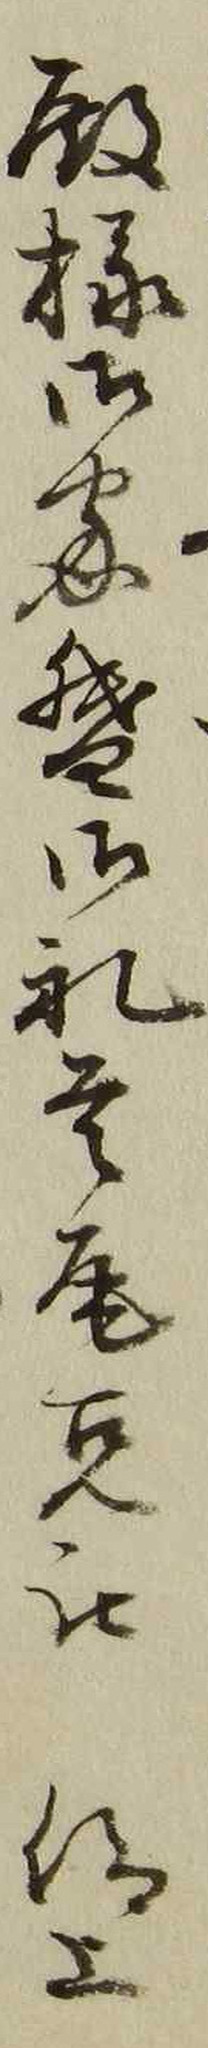殿様御家督御礼首尾事被仰上
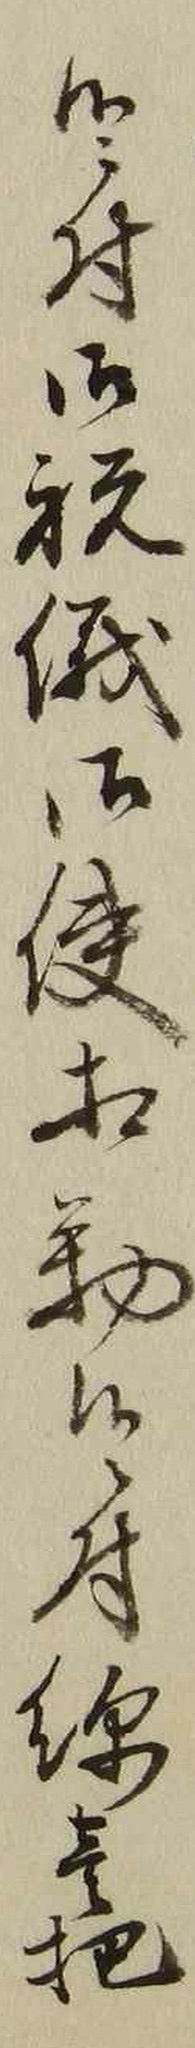候ニ付御祝儀御使相勤候ニ付綿壱把
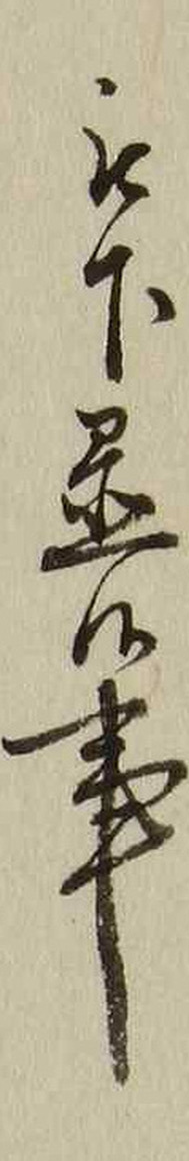被下置候事
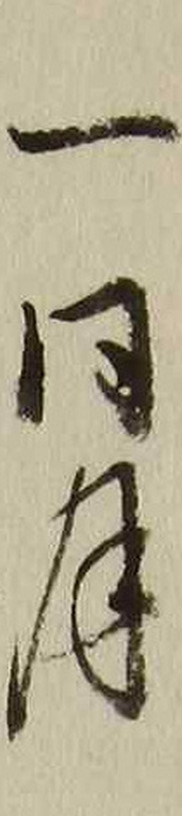一同月
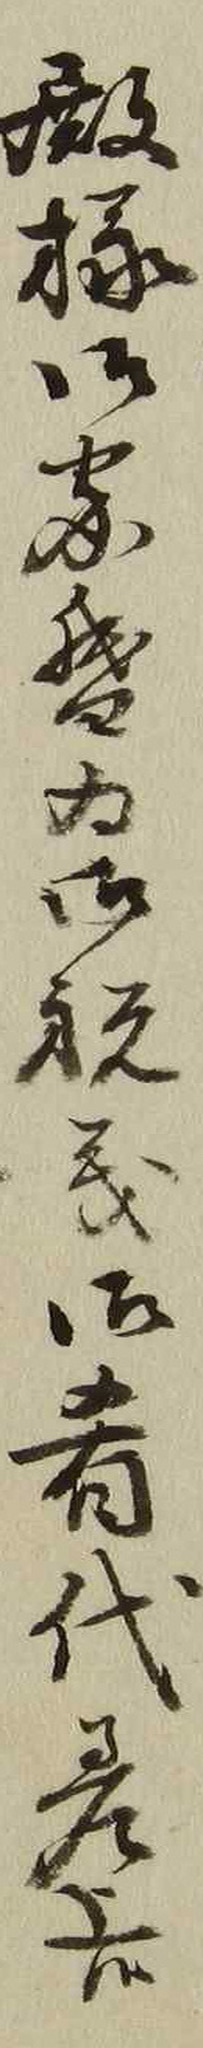殿様御家督為御祝義御肴代差上候
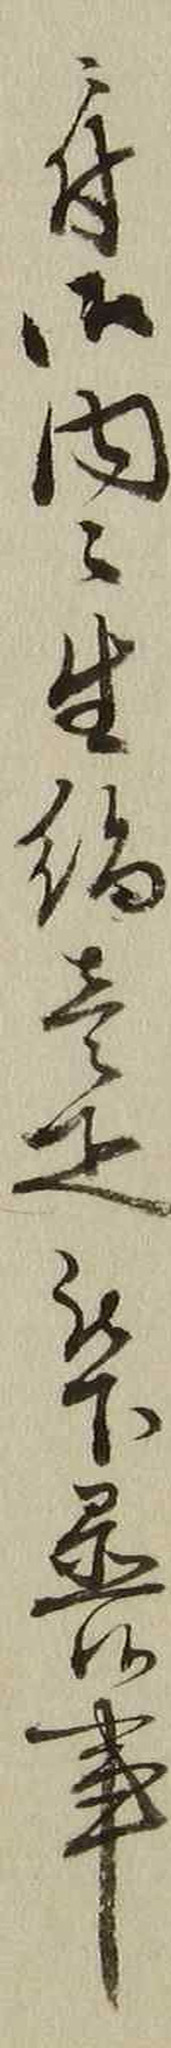ニ付御内々生絹壱疋被下置候事
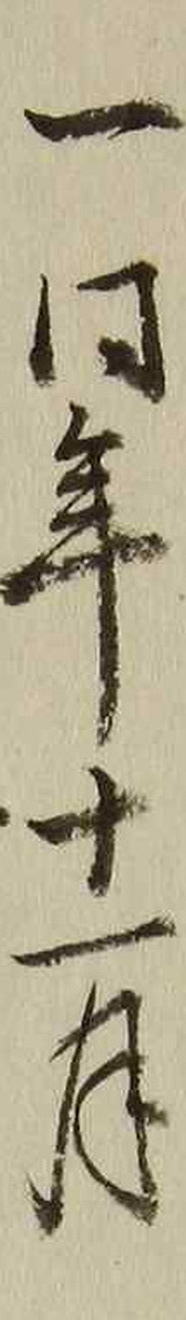一同年十一月
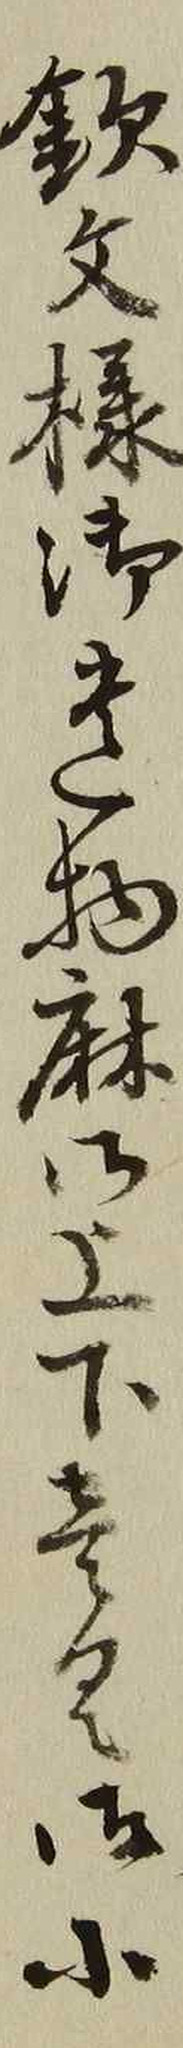欽文様御遺物麻御上下壱具御小
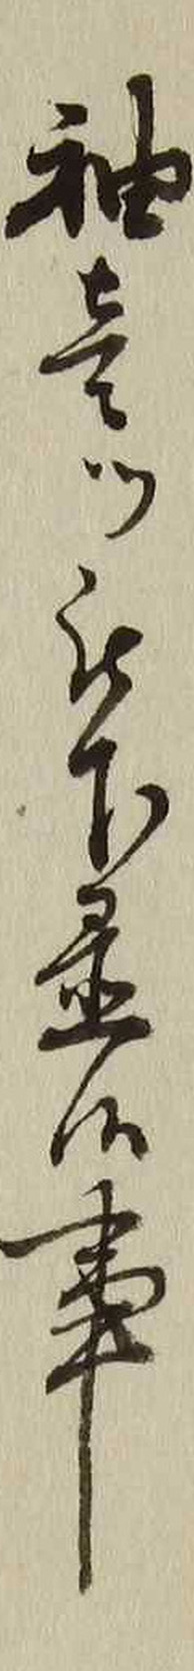袖壱ツ被下置候事
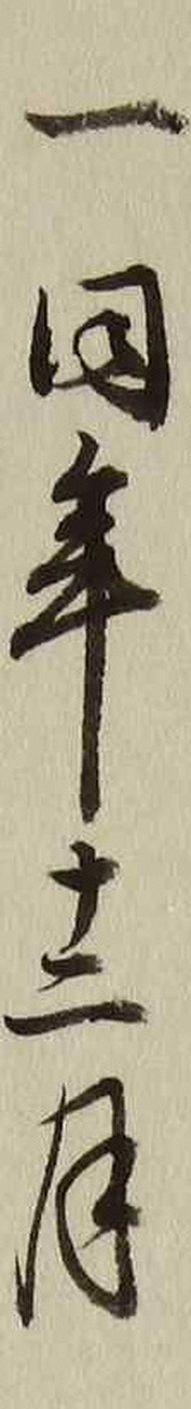一同年十二月
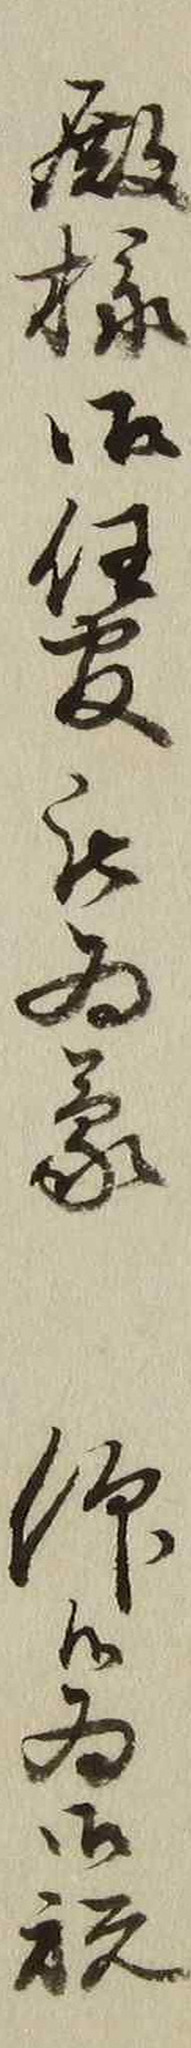殿様御任官被為蒙仰候為御祝
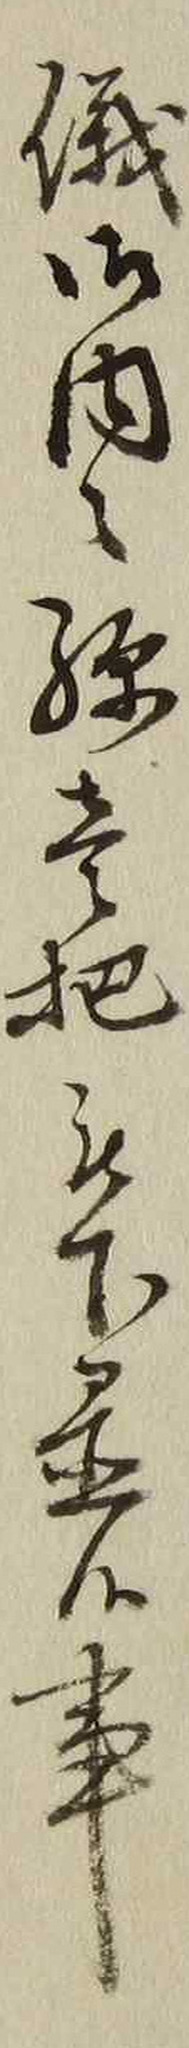儀御内々綿壱把被下置候事
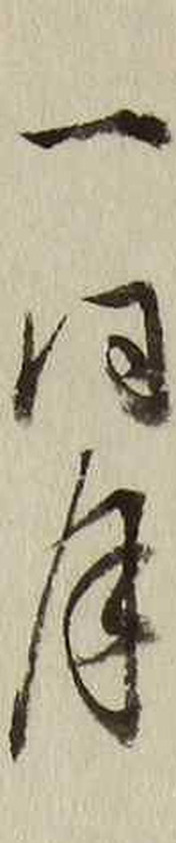一同月
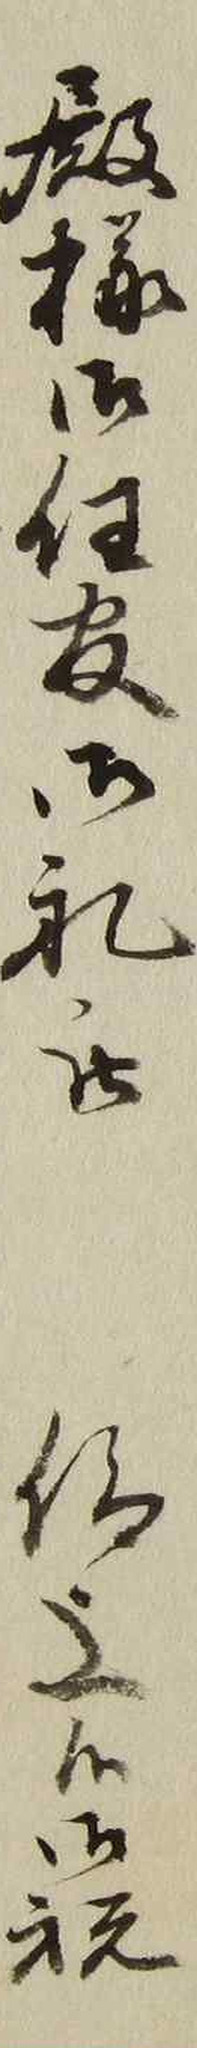殿様御任官御礼被仰上候御祝
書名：諸士系譜　巻之35　は之部3
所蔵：会津若松市立会津図書館
